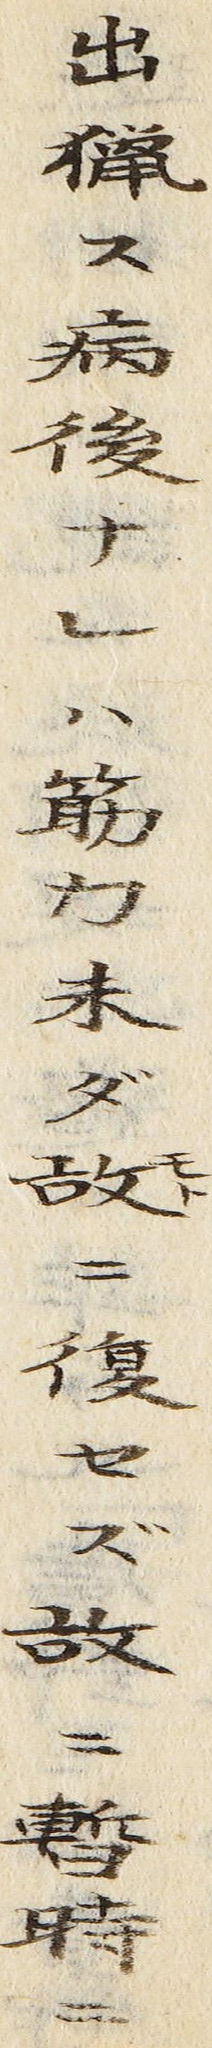出猟ス病後ナレハ筋力未ダ故ニ復セズ故ニ暫時ニ
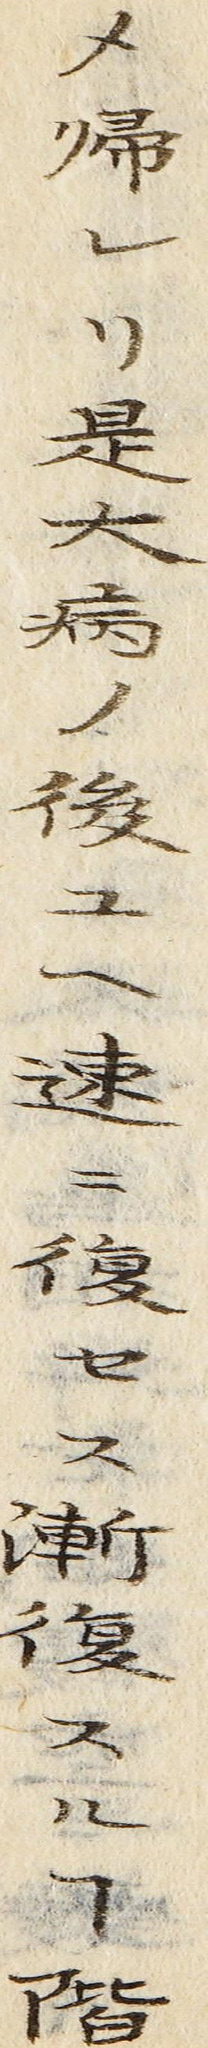シテ帰レリ是大病ノ後ユヘ速ニ復セス漸復スルコト階
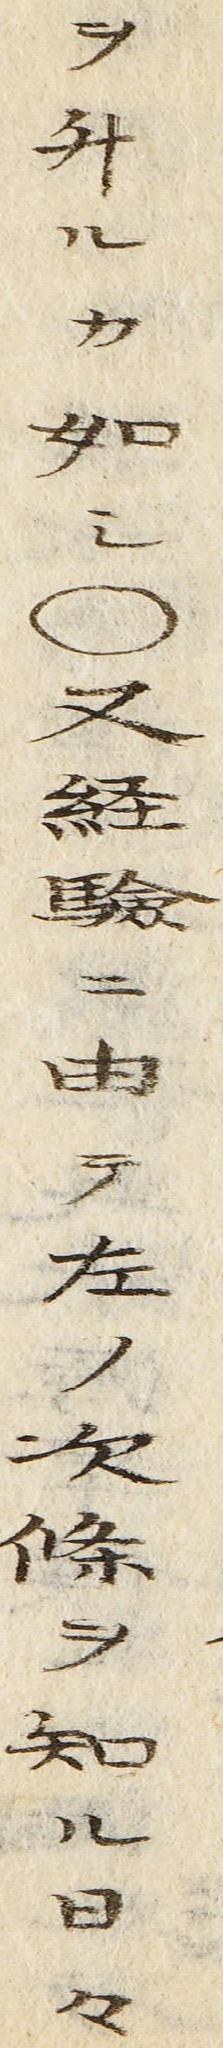ヲ昇ルカ如シ◯又経験ニ由テ左ノ次條ヲ知ル日々
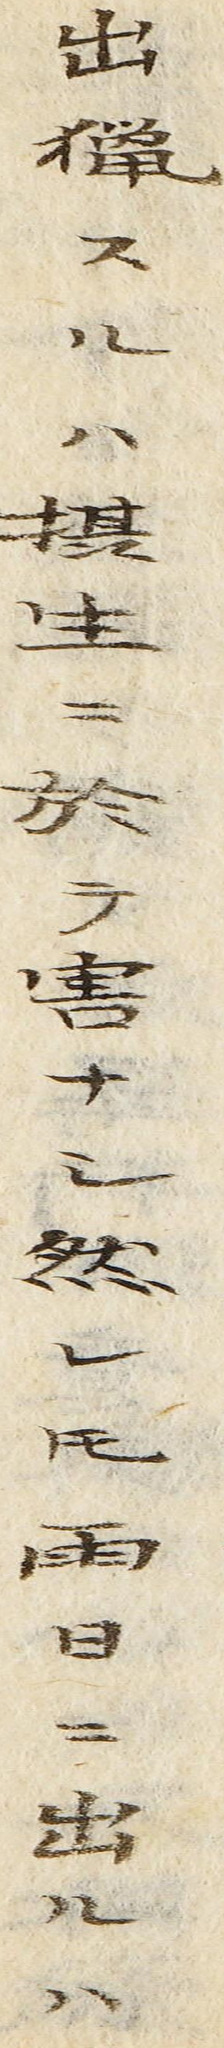出猟スルハ摂生ニ於テ害ナシ然レトモ雨日ニ出ルハ
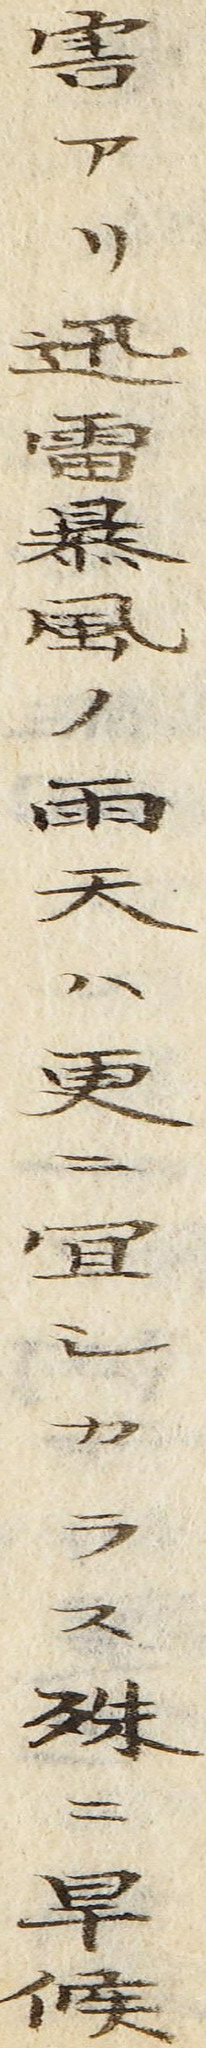害アリ迅雷暴風ノ雨天ハ更ニ宜シカラス殊ニ旱候
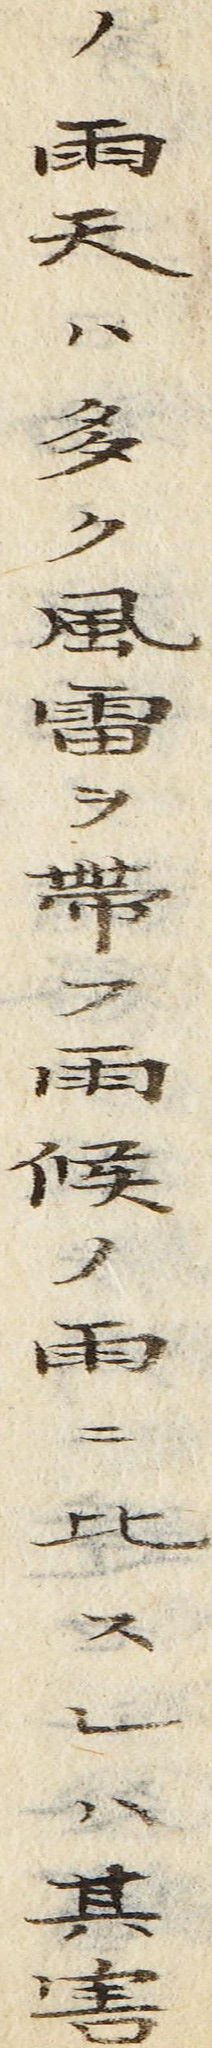ノ雨天ハ多ク風雷ヲ帯フ雨候ノ雨ニ比スレハ其害
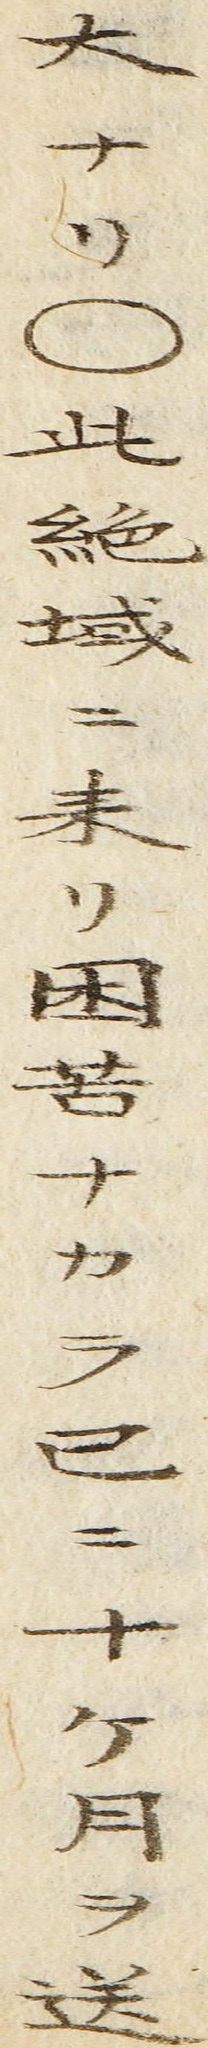大ナリ◯此絶域ニ来リ困苦ナカラ已に十ケ月ヲ送
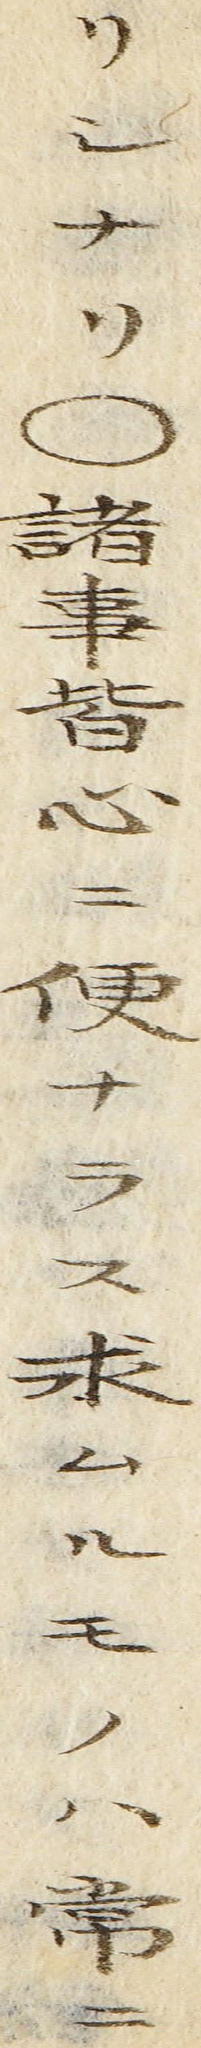リシナリ◯諸事皆心ニ便ナラス求ムルモノハ常ニ
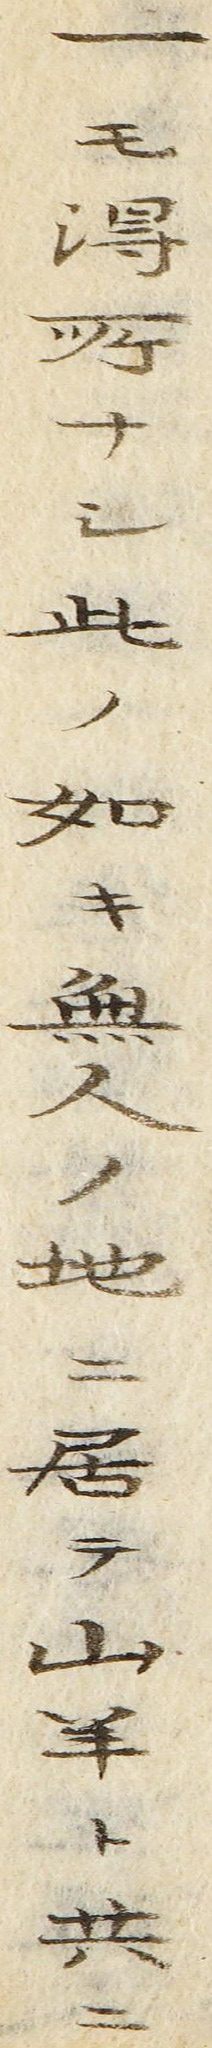一モ得所ナシ此ノ如キ無人ノ地ニ居テ山羊ト共ニ

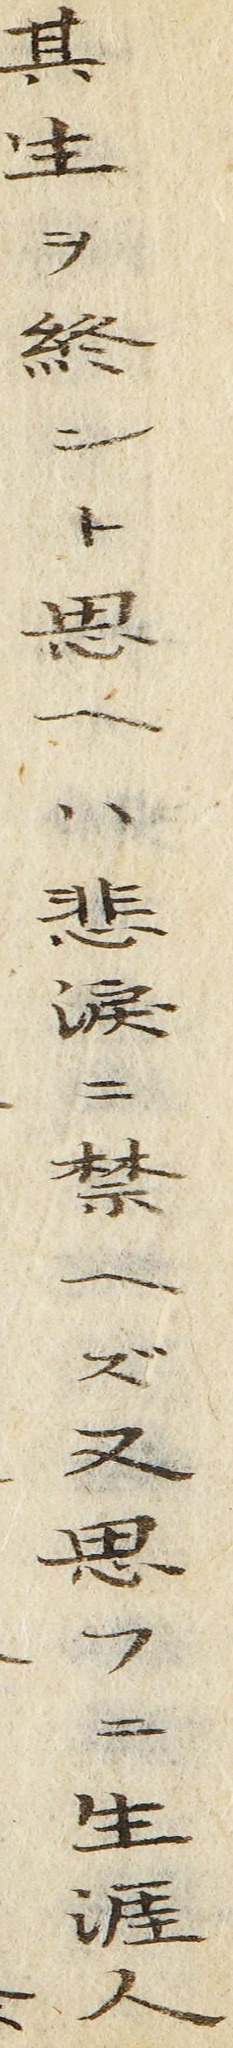其生ヲ終ント思ヘハ悲涙ニ禁ヘズ又思フニ生涯人
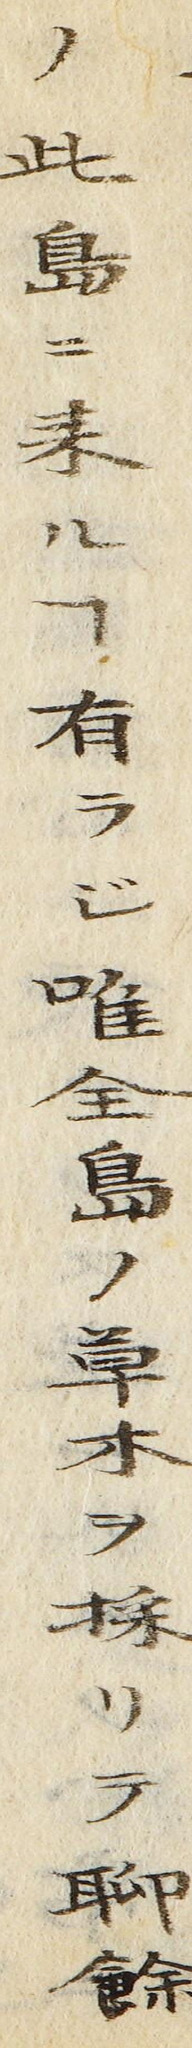ノ此島ニ来ルコト有ラジ唯全島ノ草木ヲ採リテ聊余
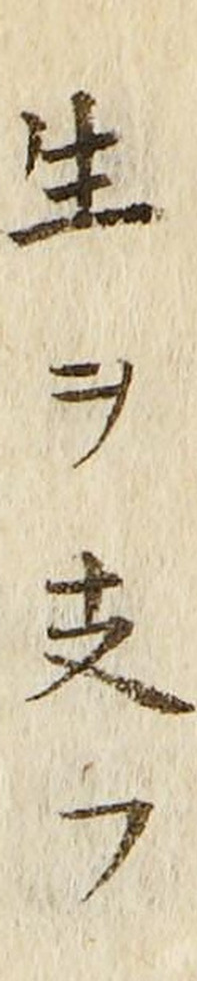生ヲ支フ
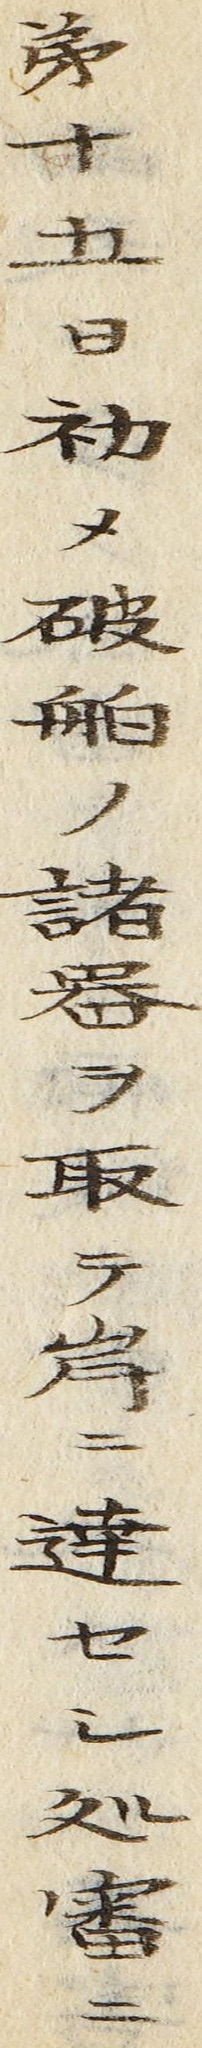第十五日初メ破舶ノ諸器ヲ取テ岸ニ達セシ処審ニ
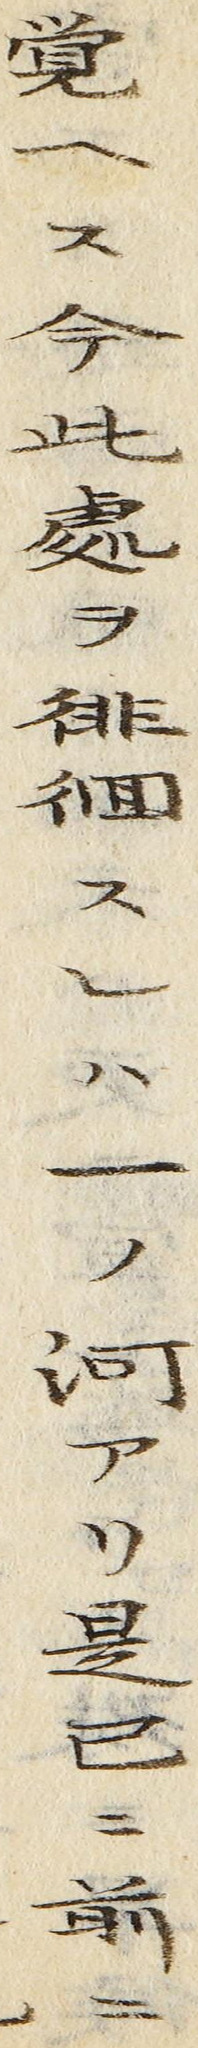覚ヘス今此処ヲ徘徊スレハ一ノ河アリ是已ニ前ニ
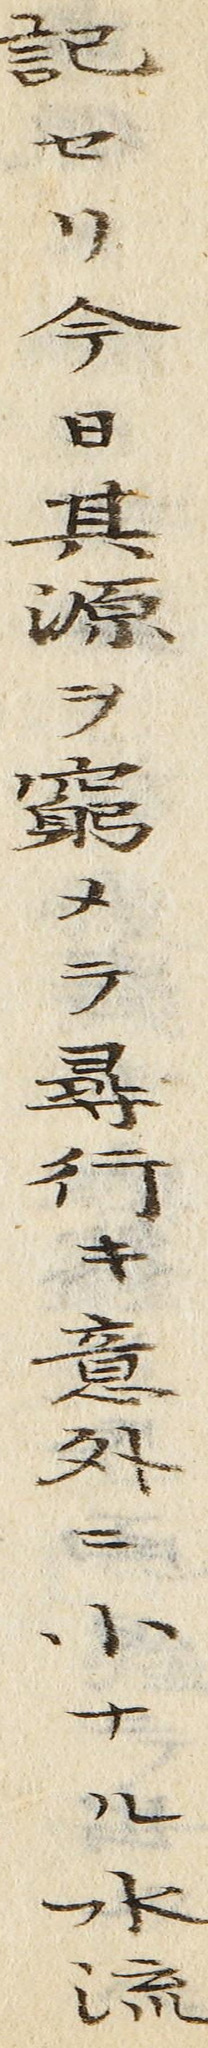記セリ今日其源ヲ窮メラ尋行キ意外ニ小ナル水流
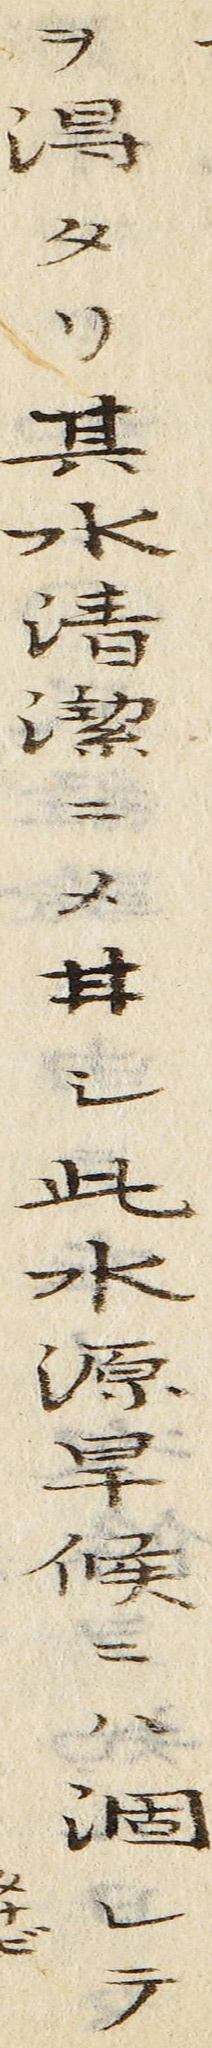ヲ得タリ其水清潔ニシテ甘シ此水源旱候ニハ涸レテ
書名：漂流紀事
